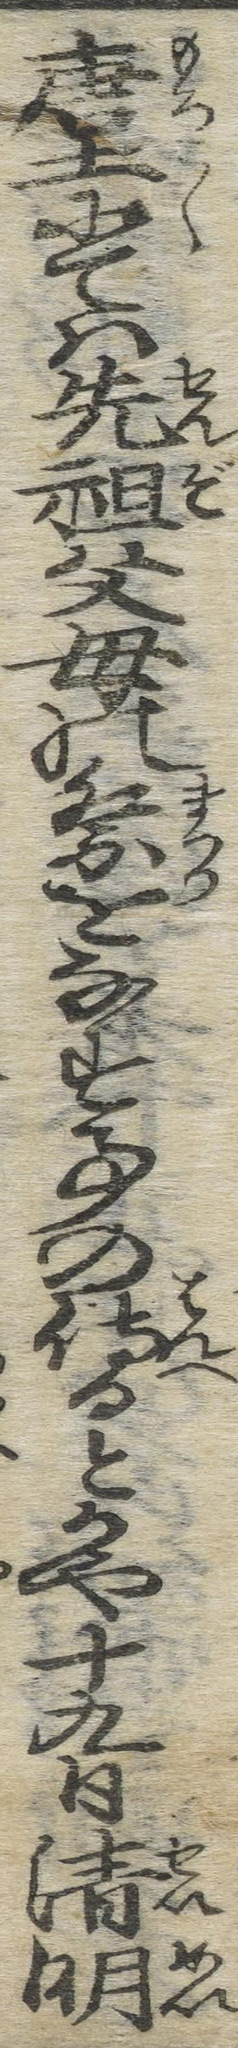唐土にては先祖父母の祭をなす事の侍るとかや十九日清明
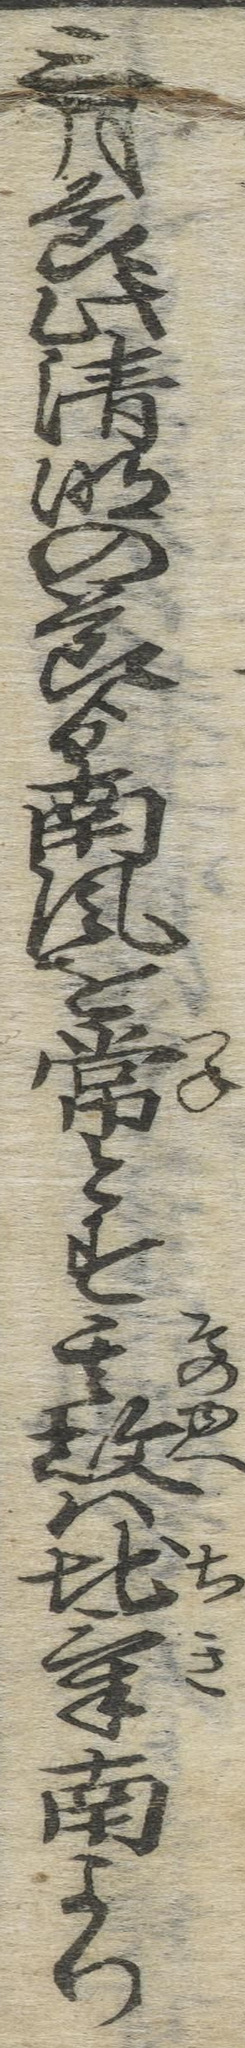三月前此清明の前ゟ南風を常とす其故は地気南より

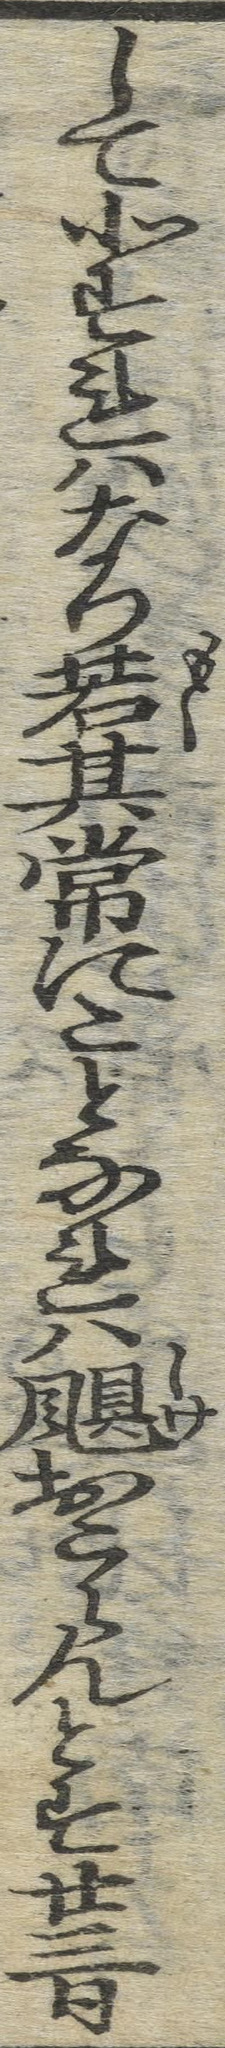して北すれはなり若其常にことなれは颶おこらんとす廿三日
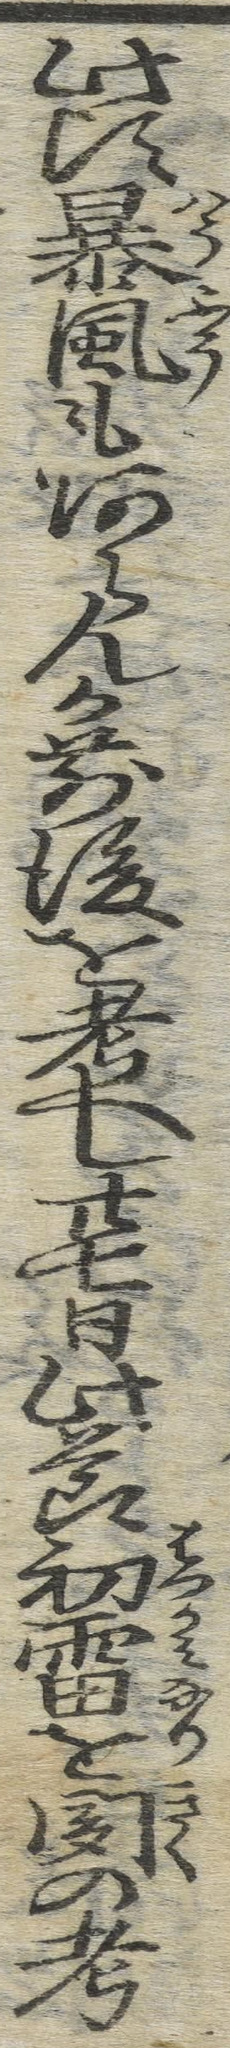此頃暴風もあらんか前後を考へし廿七日此節初雷を聞の考
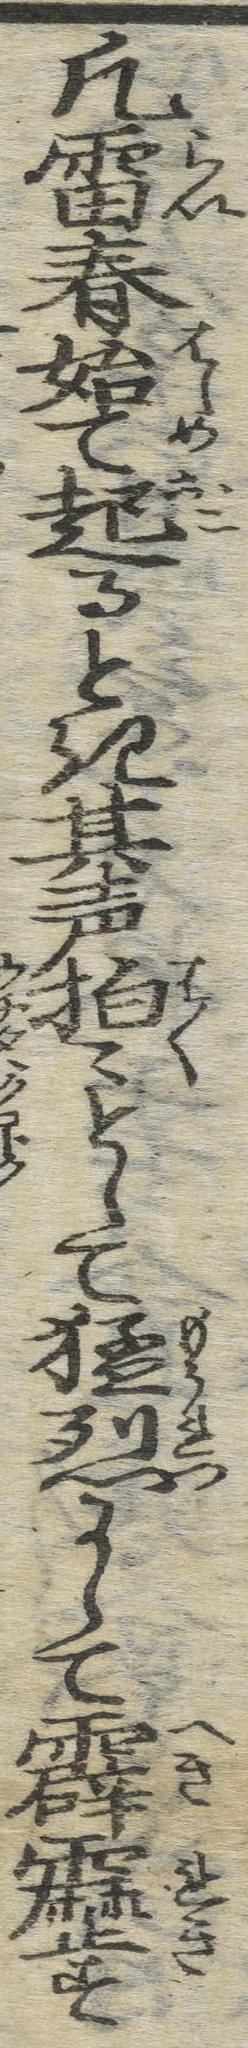凡雷春始て起るとき其声拍〻として猛烈にして霹靂す
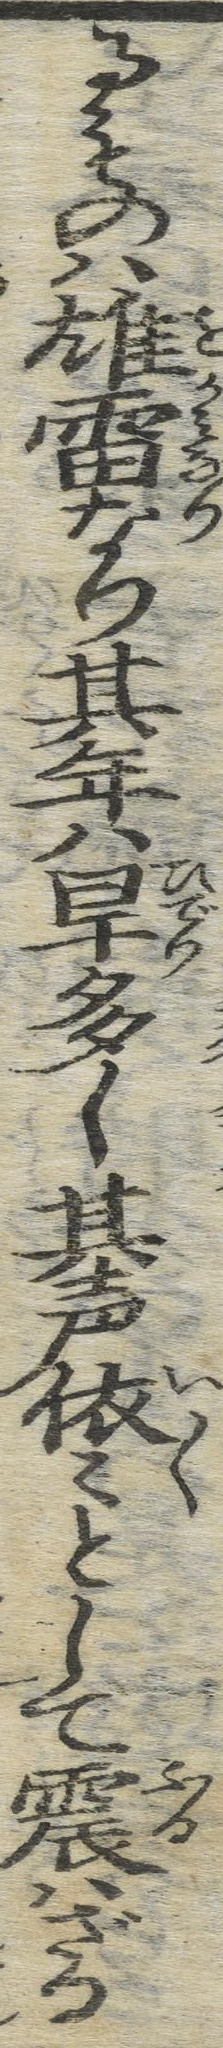ることのは雄雷なり其年は旱多し其声依〻として震はざる
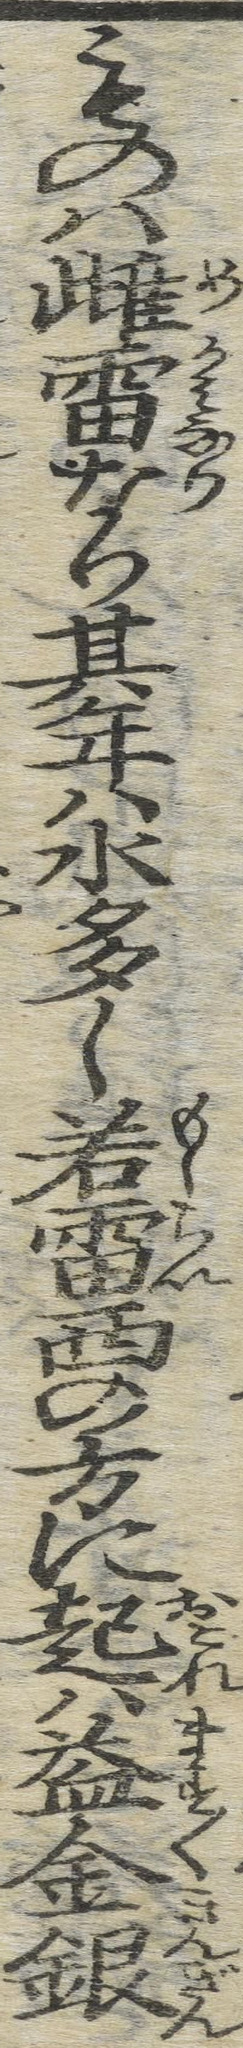ことのは雌雷なり其年は水多し若雷西の方に起は益金銀
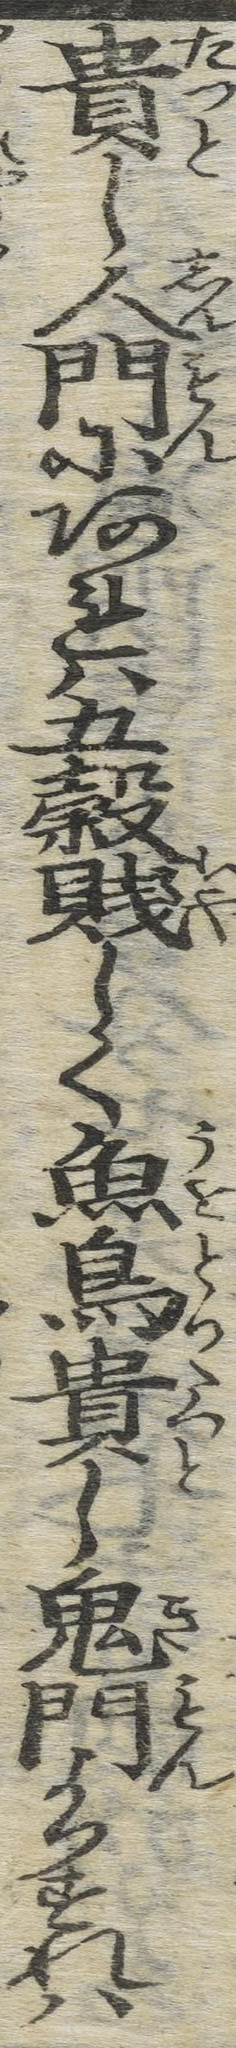貴し人門にあれは五穀賎しく魚鳥貴し鬼門よりすれは
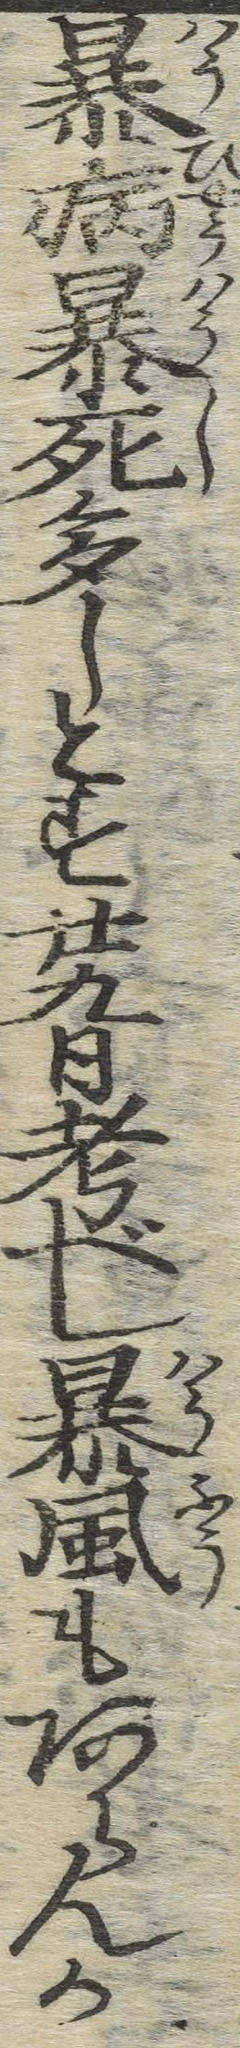暴病暴死多しとす廿九日考べし暴風もあらんか
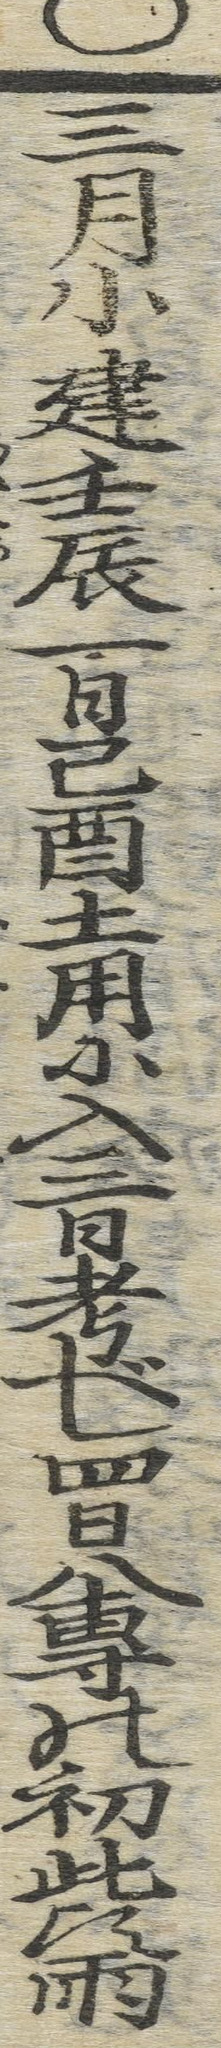三月小建壬辰一日己酉土用に入三日考べし四日八専の初此頃雨
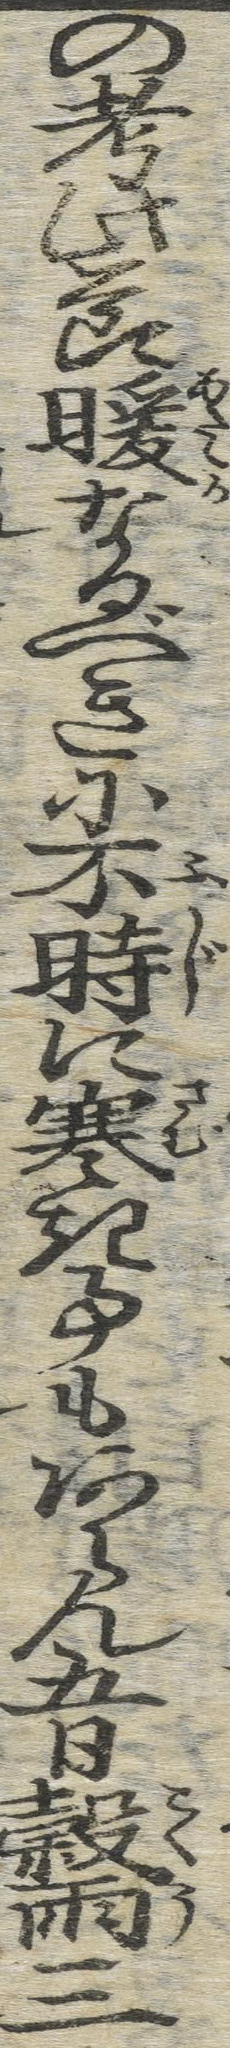の考此節暖なるべきに不時に寒き事もあらん五日穀雨三
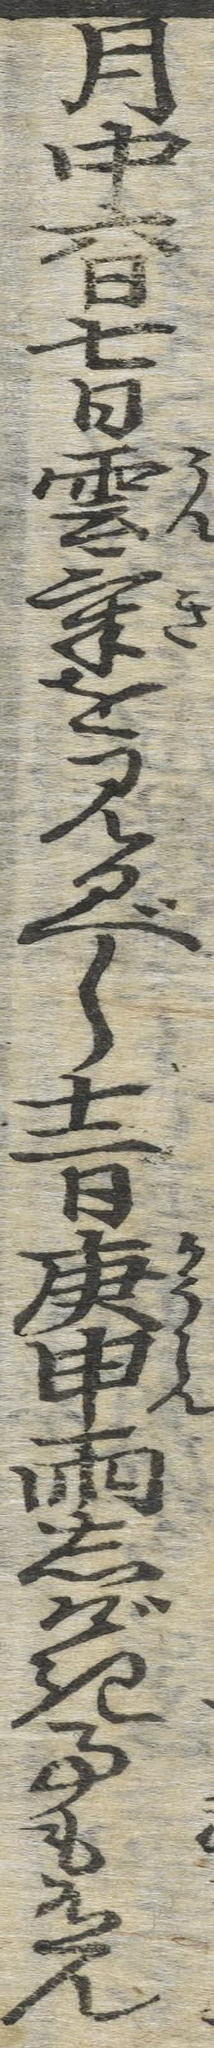月中六日七日雲気を見るべし十二日庚申雨しげき事も有ん
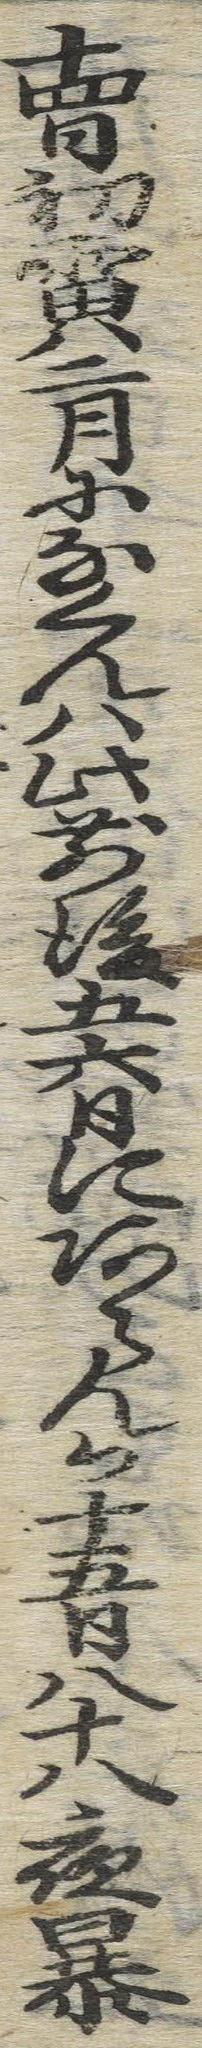十四日初雷は二月になくんは此前後五六日にあらんか十五日八十八夜暴
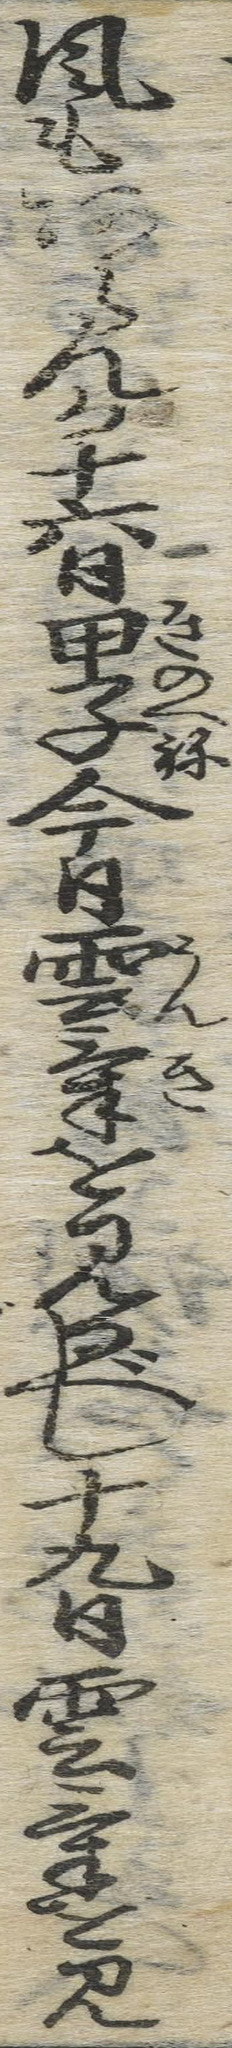風もあらんか十六日甲子今日雲気を見るべし十九日雲気を見
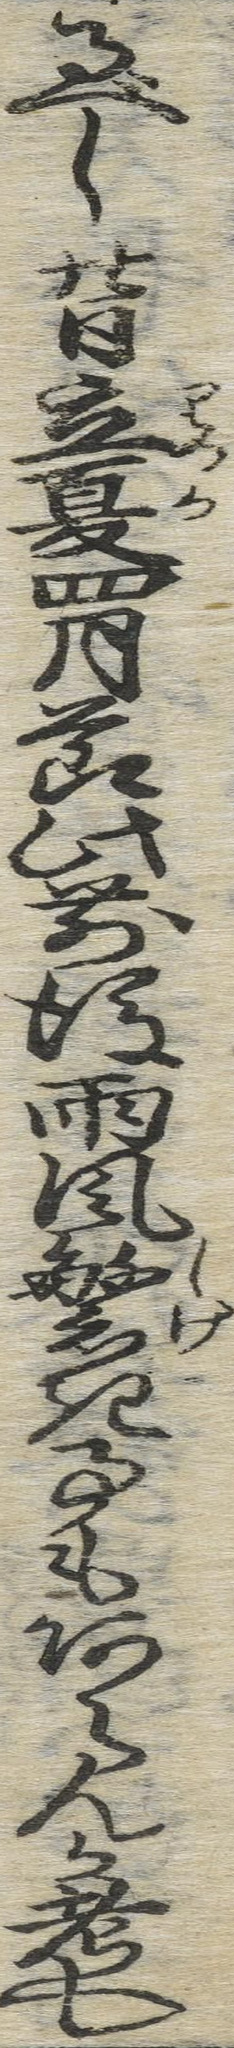るべし廿日立夏四月節此前後雨風繁き事もあらんか考へし
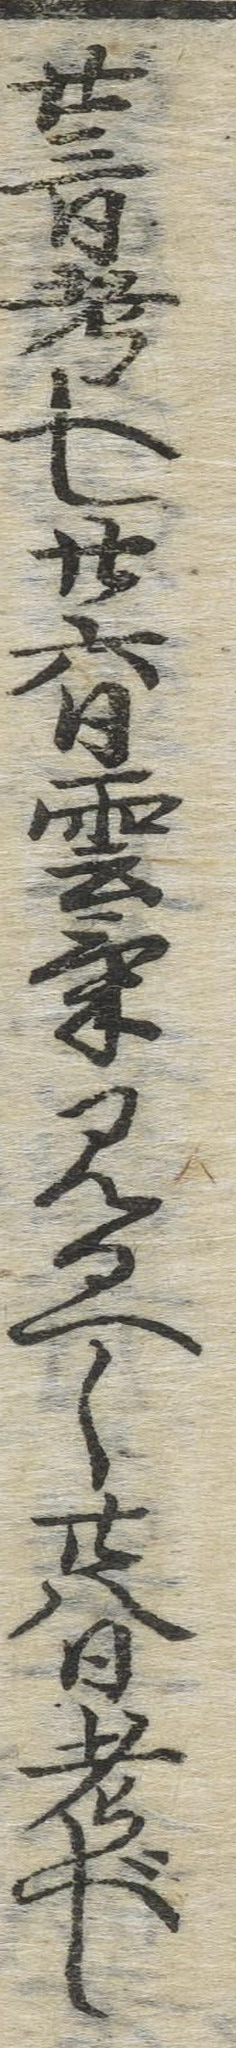廿三日考へし廿六日雲気見るへし廿八日考べし
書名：[晴雨考]
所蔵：東京大学地震研究所図書室 Earthquake Research Institute Library, The University of Tokyo, JAPAN
